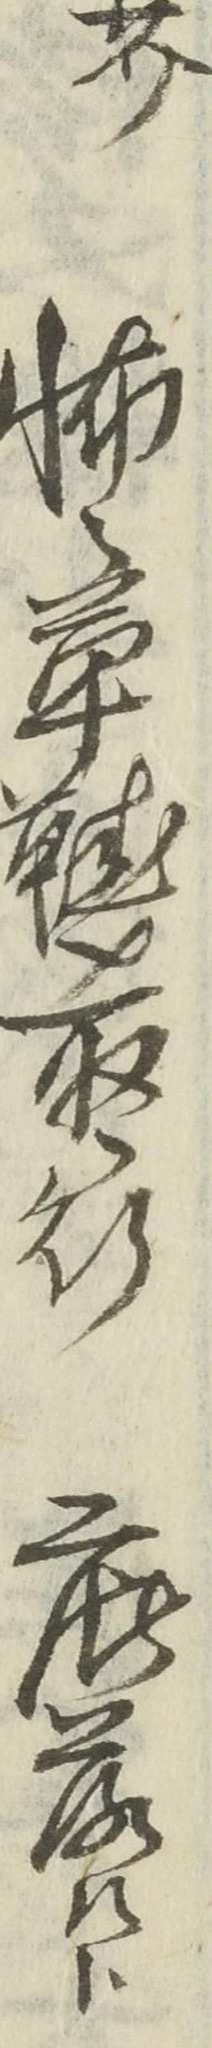芥怖〻草鞋ヲ取ニ行庇落ルト
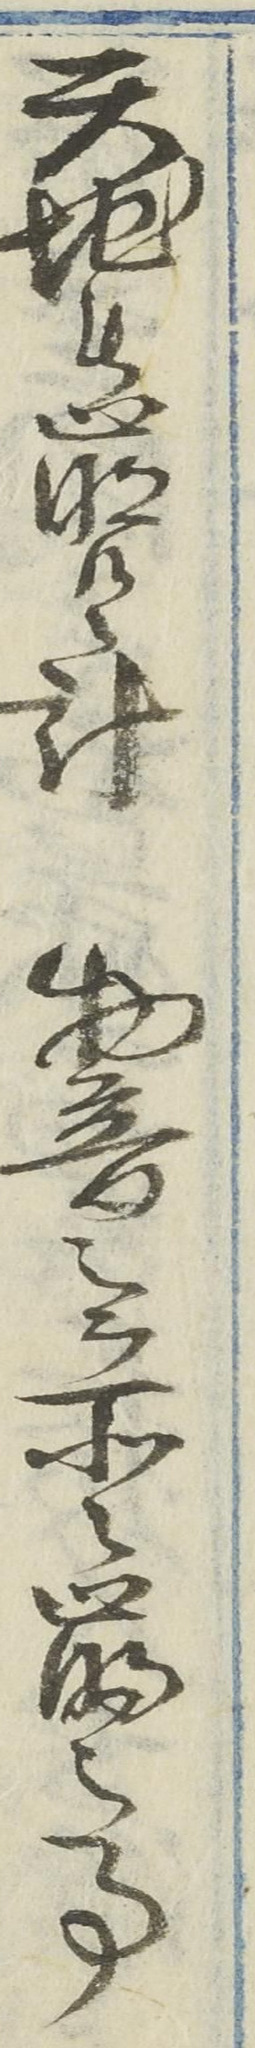天地モ崩ルヽ計物音シテ所之崩之事
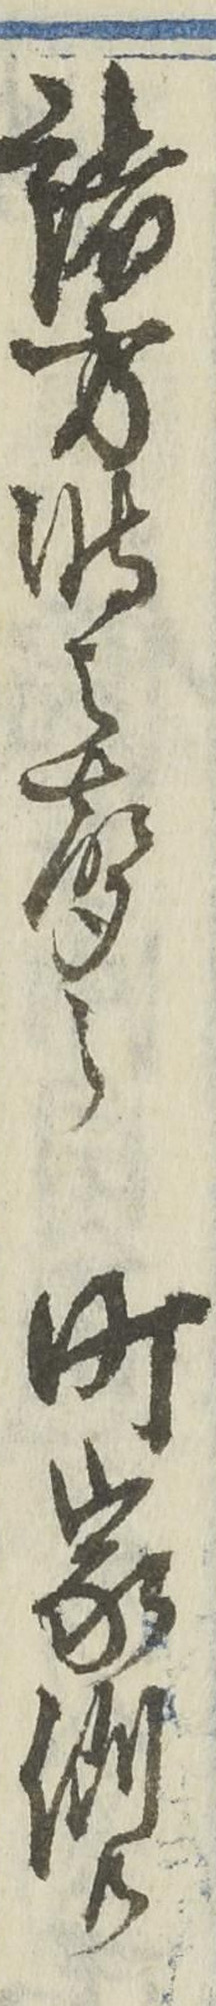諸方時之聲ニ町家倒ル
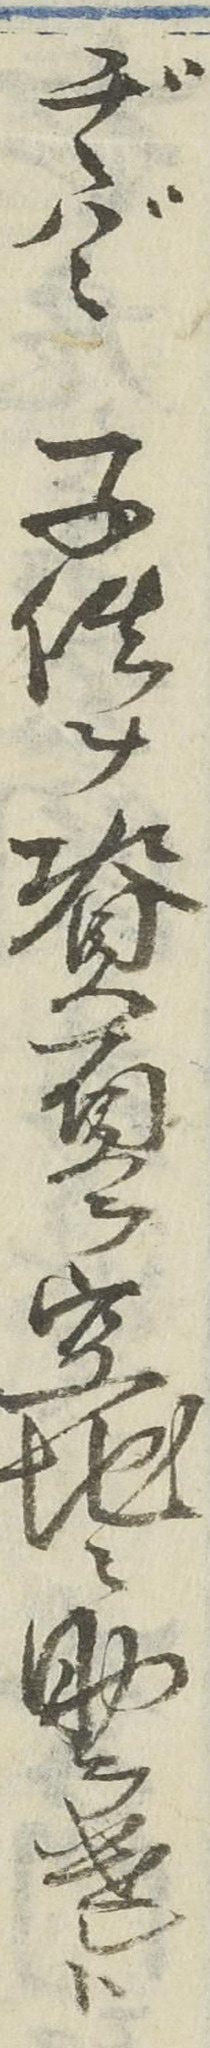ヂヽバヽ子供ヲ背負テ空地ニ助テ遺シト
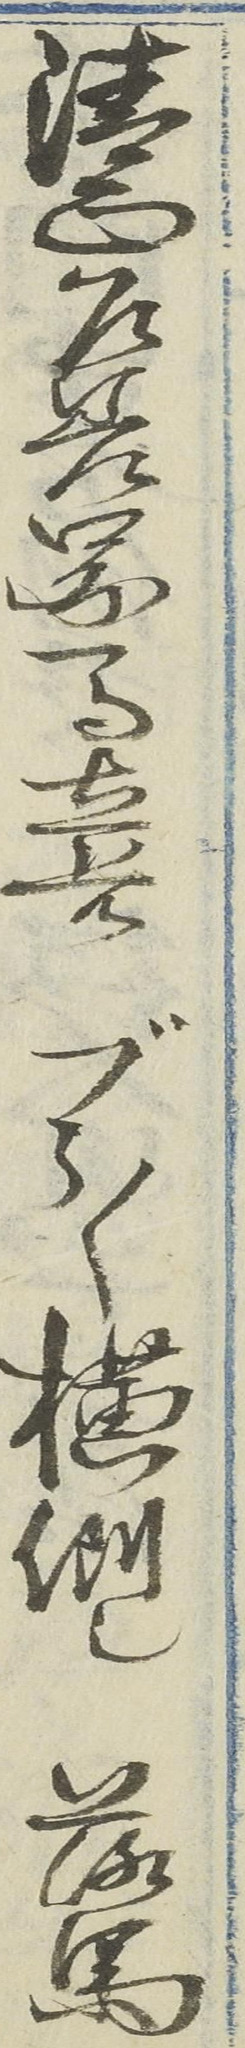清正乍指図馬立上ルブラ〳〵横倒シ落馬
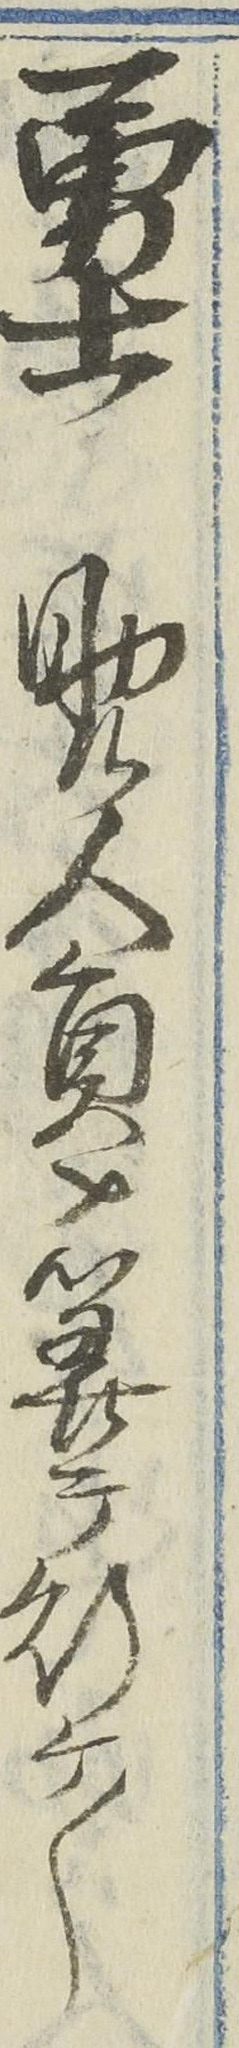勇士助ル人員ヲ算テ行ケ〳〵
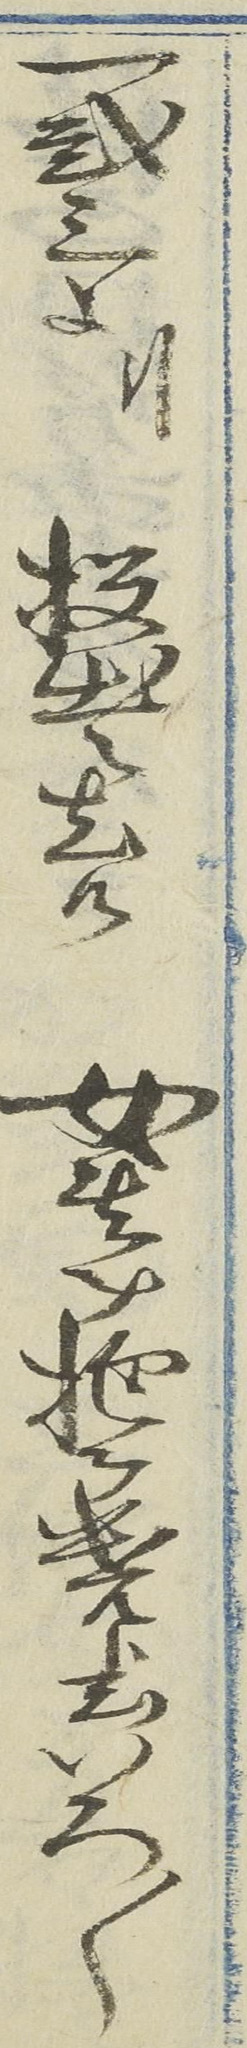一弐三より？投出之去ル女共ヲ抱テ遣ト云いろ〳〵

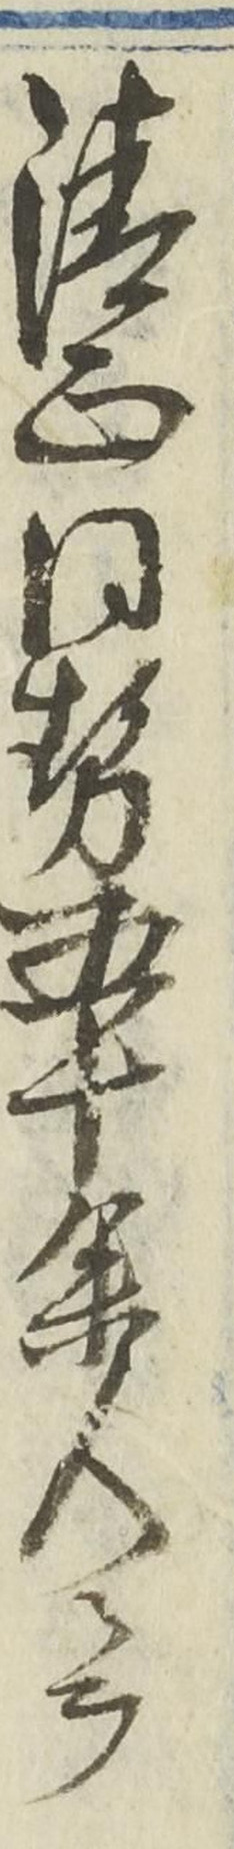清正同勢五十余人ニテ
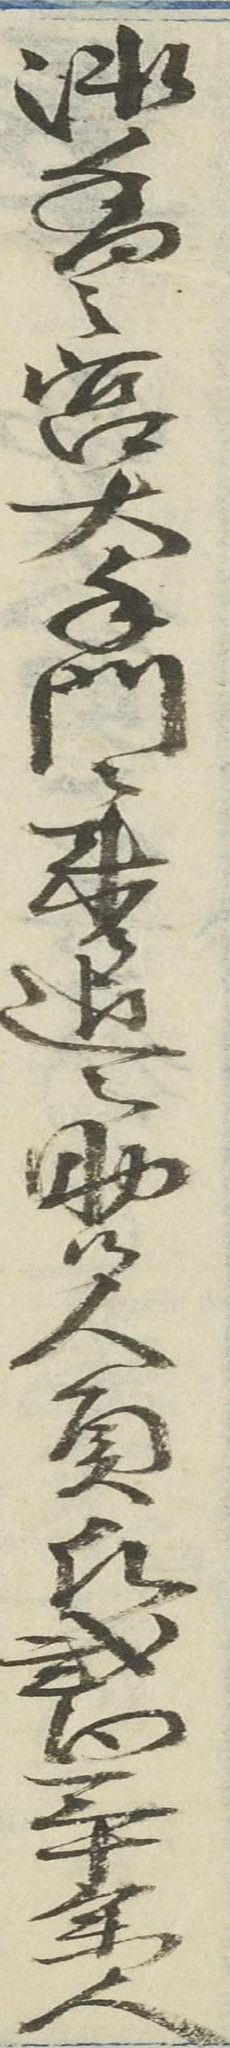御香之宮大手門ニ来ル迄ニ助ル人員凡弐百三十余人
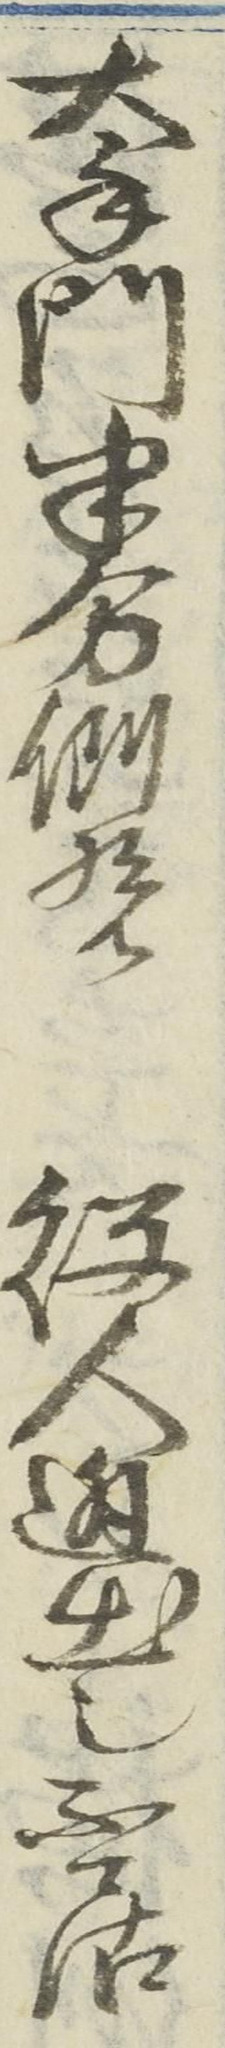大手門半分倒有ル役人逃出し不居
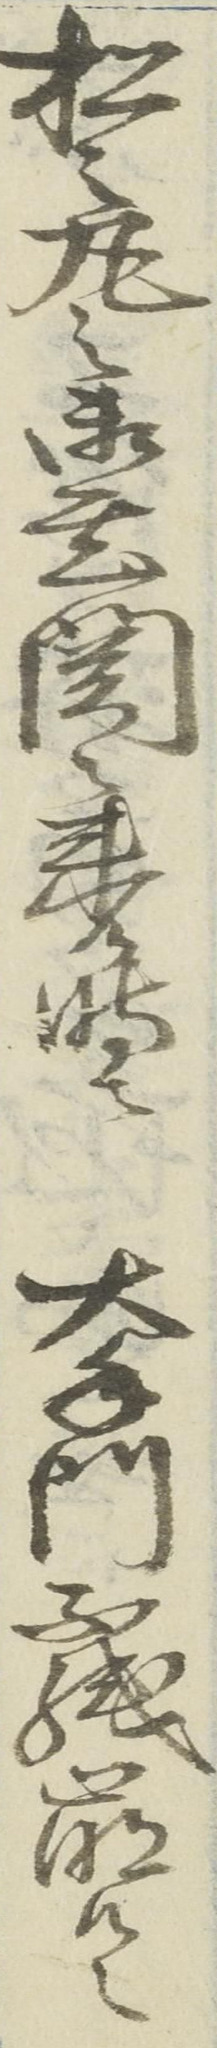松之丸之御玄関ニ来ル時ニ大手門不残崩ルヽ
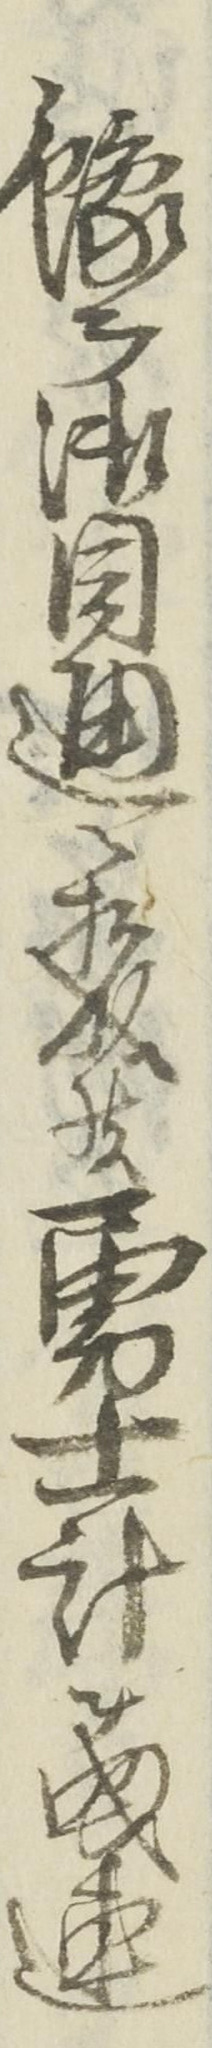清豫テ御目通ニ相成候勇士計ヲ曳連
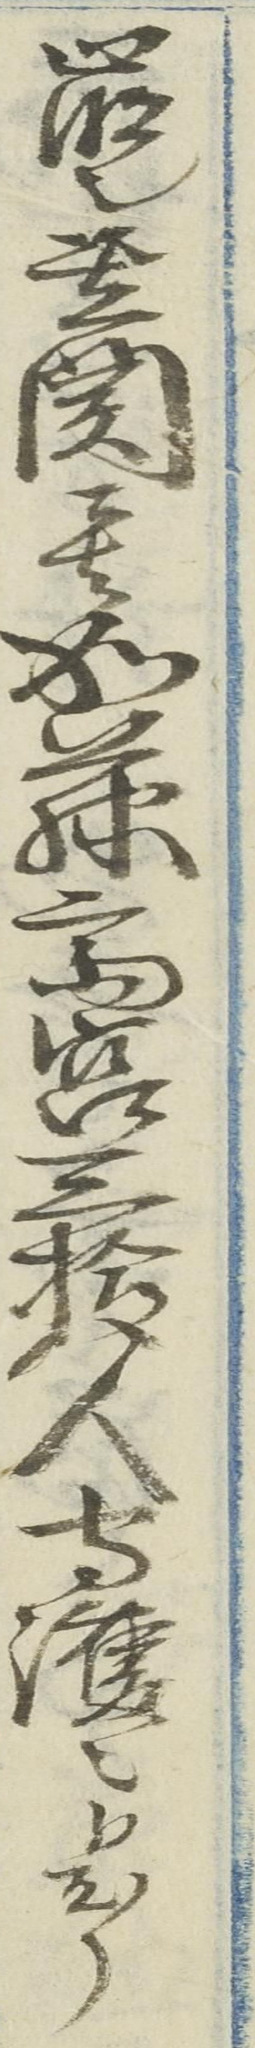崩レ玄関は加藤斉宮三拾八人守護ニト云リ
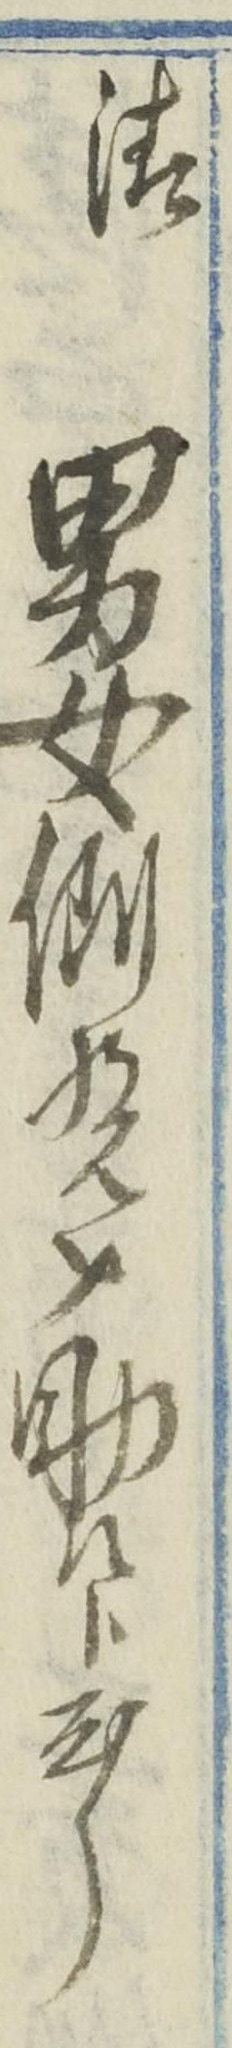清男女倒有ルヲ助ルト云ウ
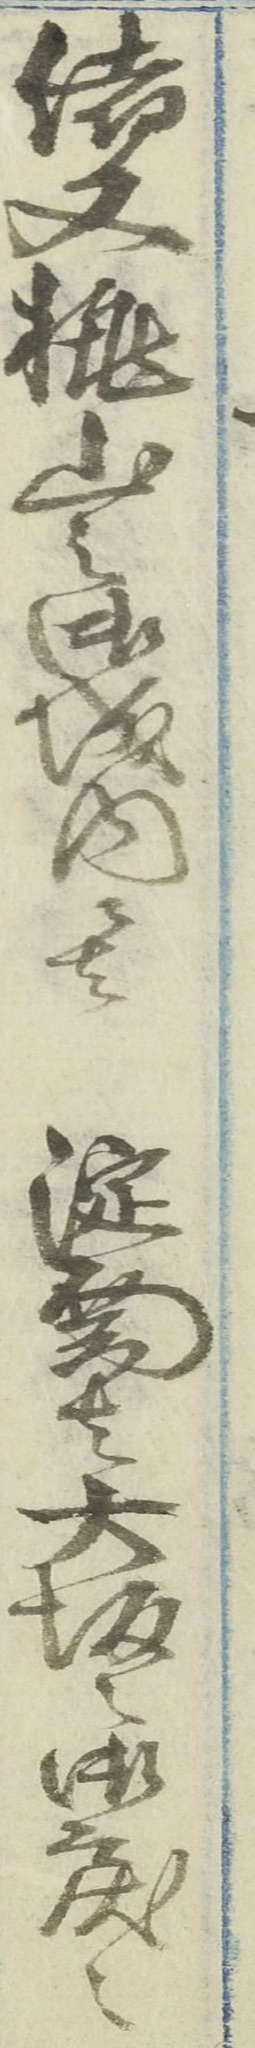偖又桃山之御城内ニは淀殿は大坂ニ御戻也
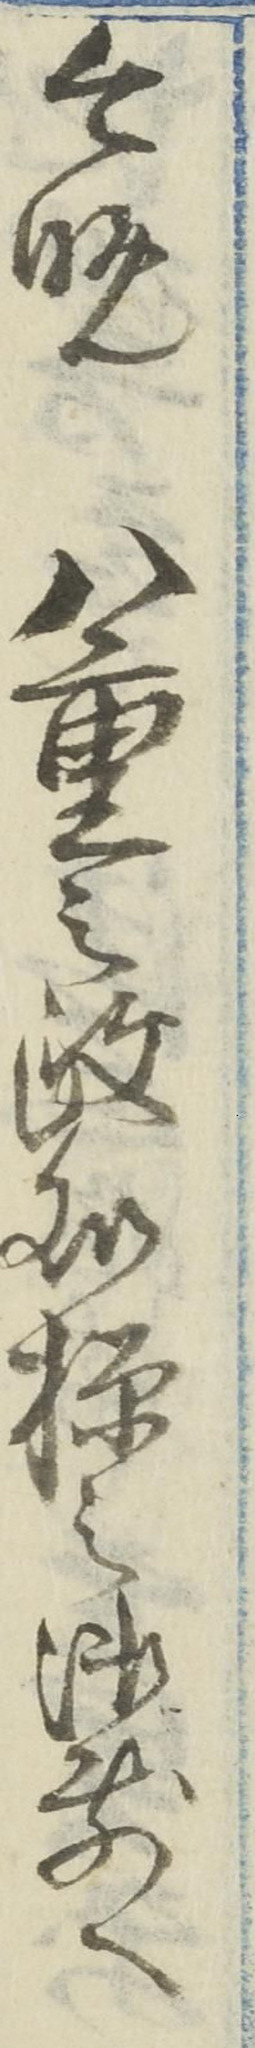今晩八重之政処様之御前ヘ
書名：伏水大地震
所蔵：東京大学地震研究所図書室 Earthquake Research Institute Library, The University of Tokyo, JAPAN
